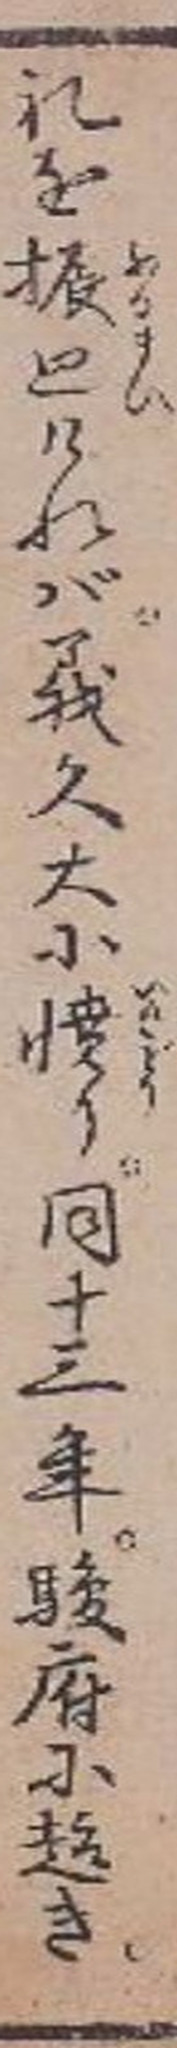礼を振廻ければ、義久大に憤り、同十三年、駿府に趣き、
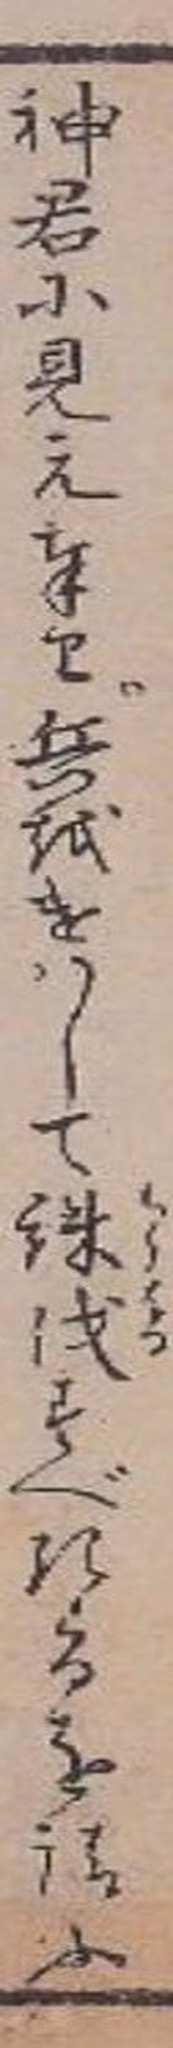神君に見え奉り、兵を遣はして誅伐すべき旨を請ふ
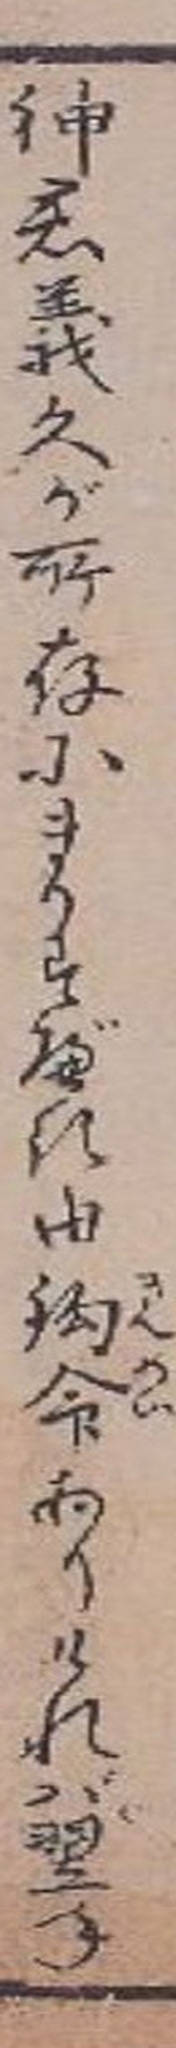神君義久が所存にまかすべき由欽命ありければ、翌年
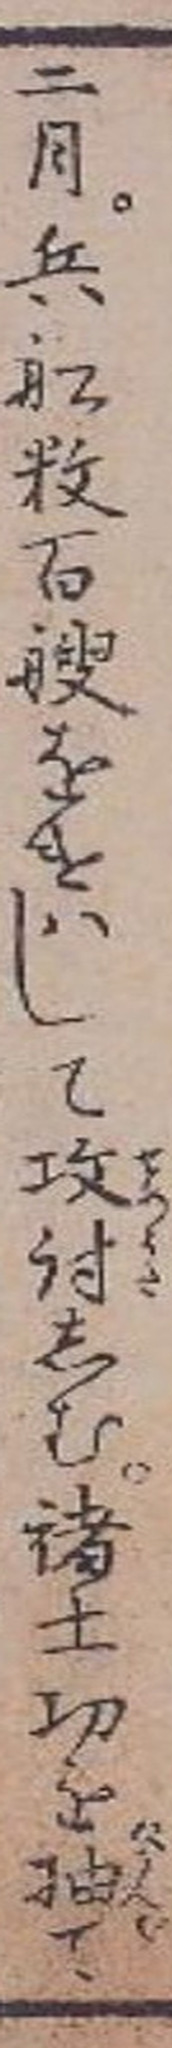二月、兵船数百艘を遣はして攻討しむ、諸士功を抽て
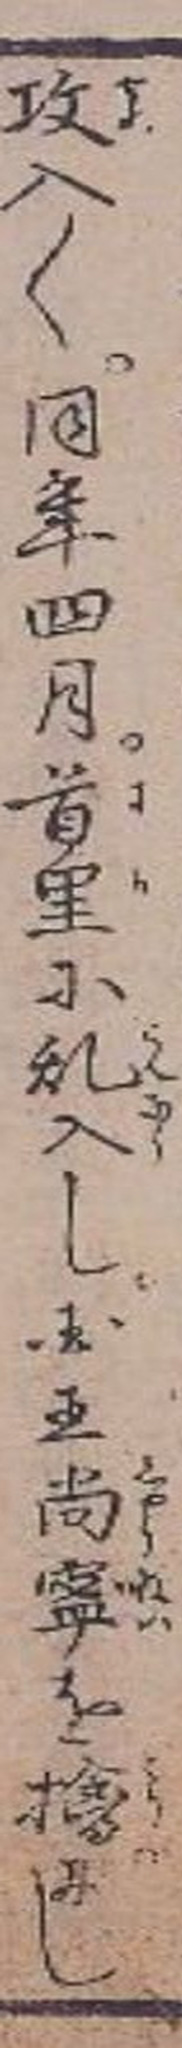攻入〳〵、同年四月、首里に乱入し、国王尚寧を擒にし
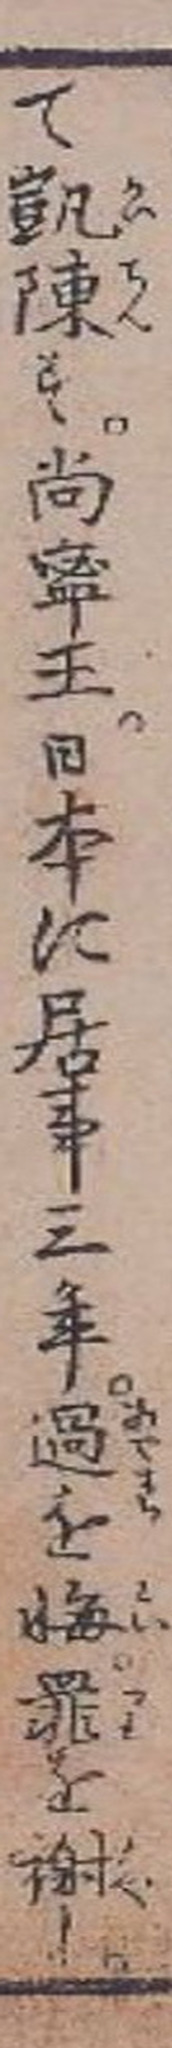て凱陳す、尚寧王、日本に居事三年、過を悔、罪を謝し、

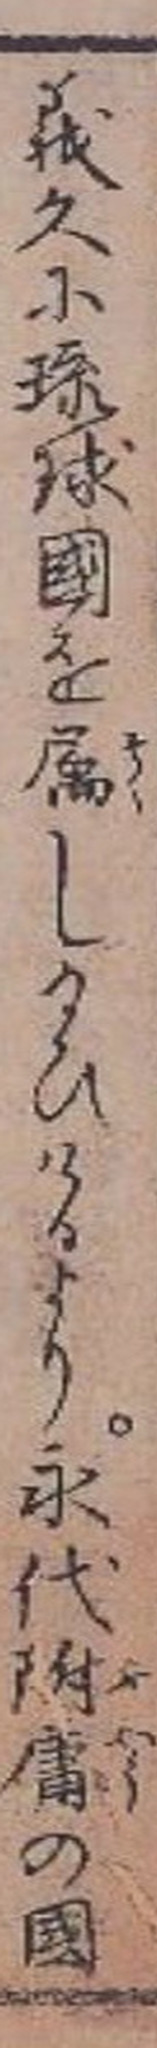義久に琉球国を属し給ひけるより、永代附庸の国
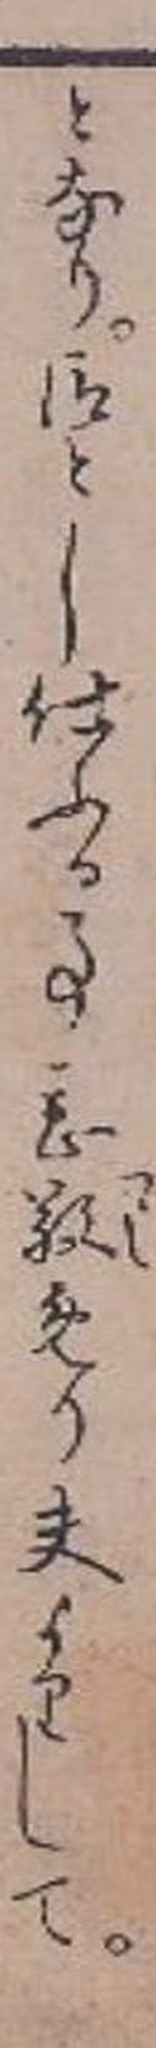となり、臣とし仕ふる事甚敬めり夫よりして、
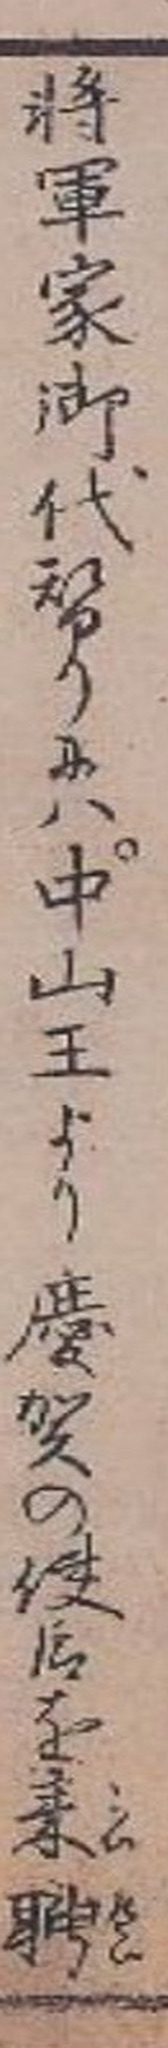将軍家御代替りには、中山王より慶賀の使臣を来聘
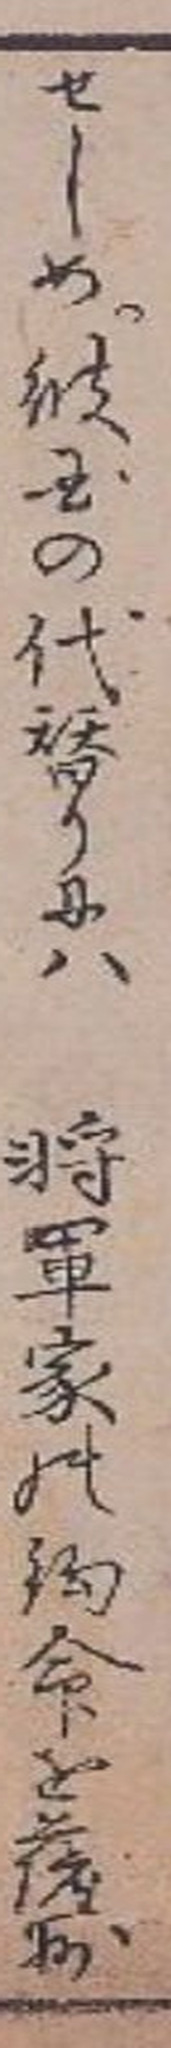せしめ、彼国の代替りには将軍家の欽命を薩州
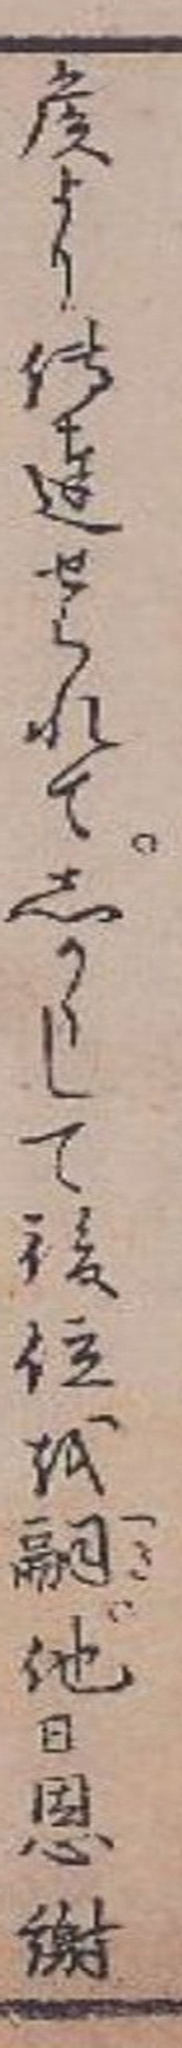侯より伝達せられて、しかうして後位を嗣、他日恩謝
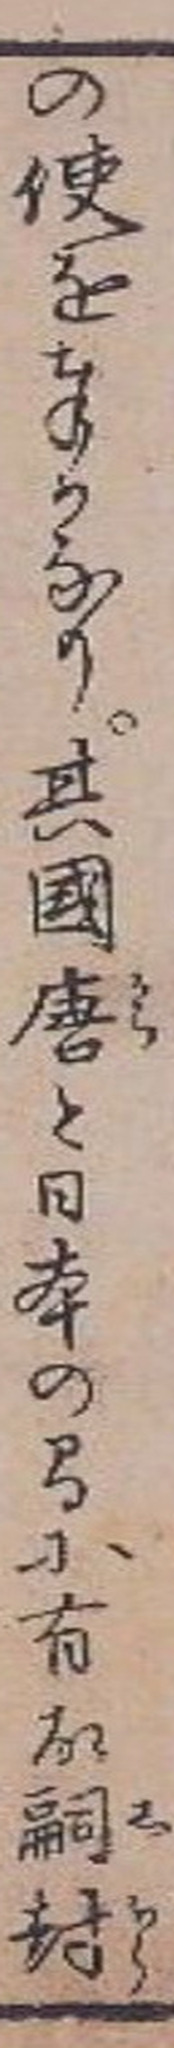の使を奉るなり、其国唐と日本の間に有故嗣封
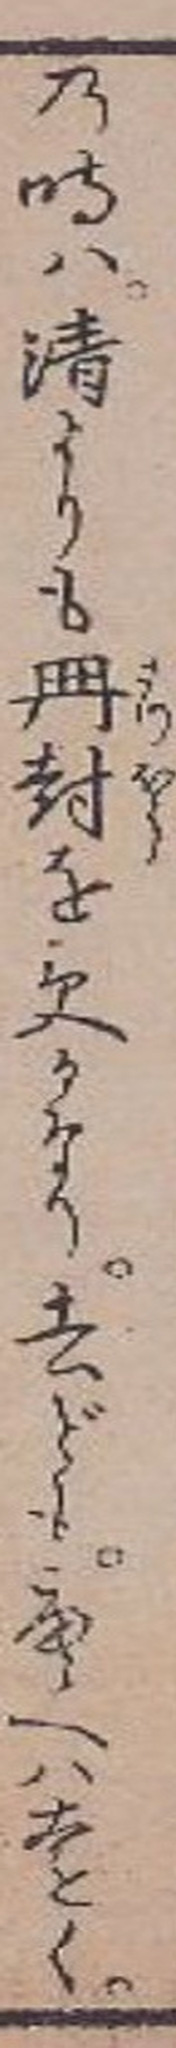の時は、清よりも冊封を受るなり、去ども、唐へは遠く、
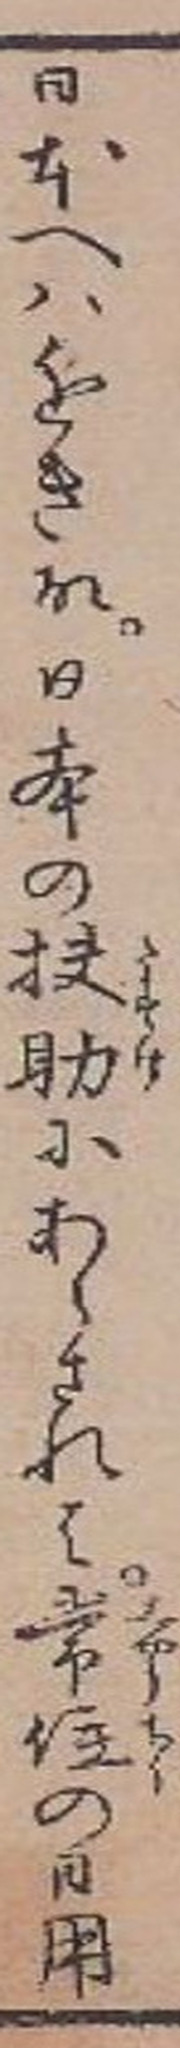日本へは近き故、日本の扶助にあらされは、常住の日用
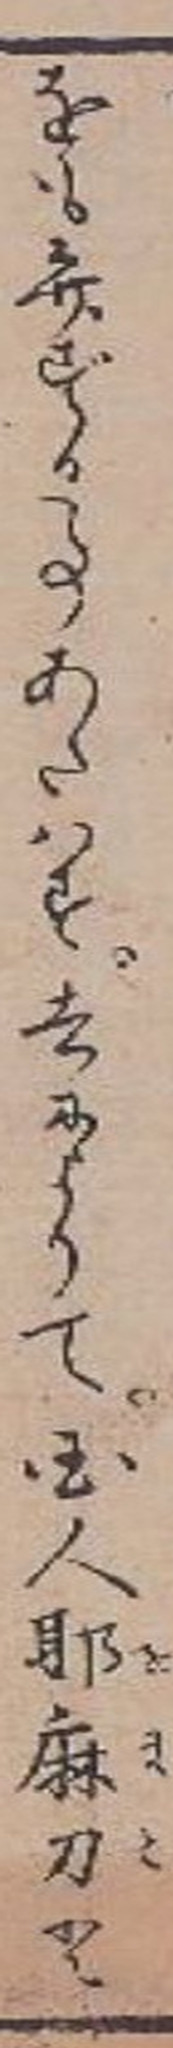をも弁ずる事あたはす、去によりて、国人耶麻刀と
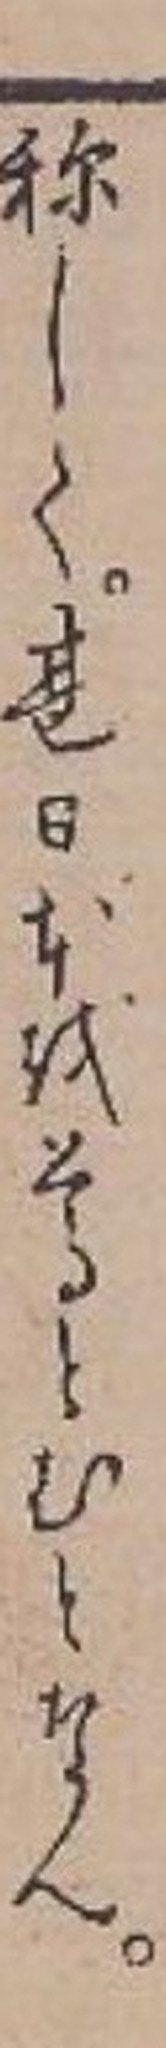称して、甚日本を尊とむとなん、
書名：琉球談
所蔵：University of the Ryukyus Library
